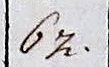62.
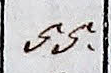55.
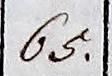65.
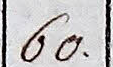60.
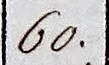60.
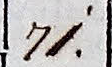71.
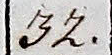32.
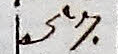57.
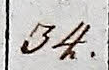34.
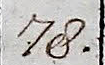78.
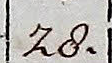28.
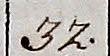32.
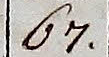67.
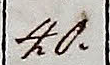40.
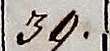39.
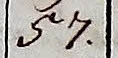57.
